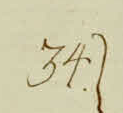34.
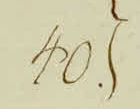40.
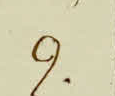9.
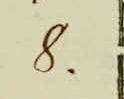8.
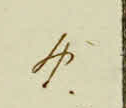4.
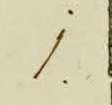1.
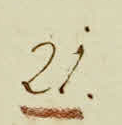21.
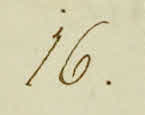16.
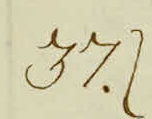37.
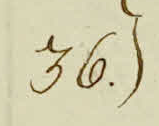36.
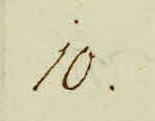10.
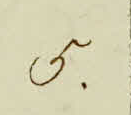5.
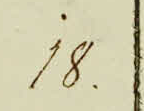18.
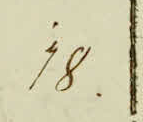18.
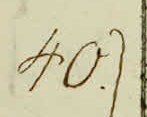40.
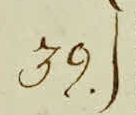39.
